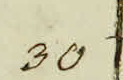30
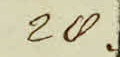28
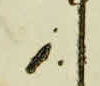1.
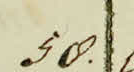58.
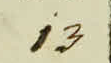13
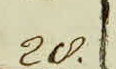28.
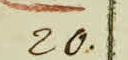20.
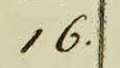16.
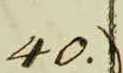40.
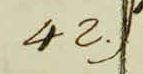42.
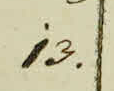13.
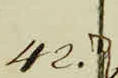42.
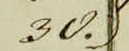30.
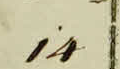14
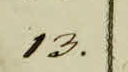13.
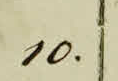10.
